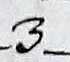3
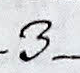3
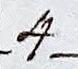4
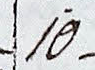10
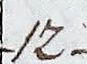12
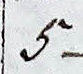5
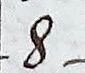8
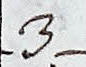3
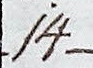14
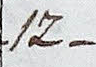12
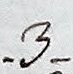3
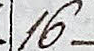16
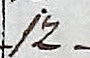12
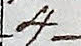4
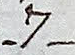7
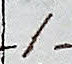1
